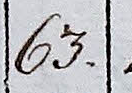63.
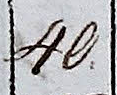40
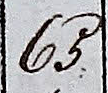65
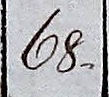68
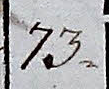73
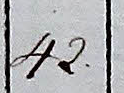42.
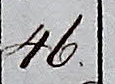46.
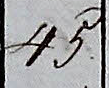45
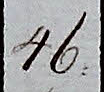46
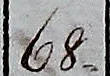68
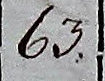63
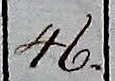46
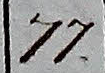77
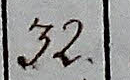32.
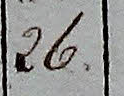26.
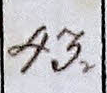43
